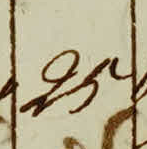25
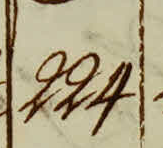224
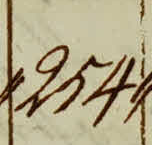254
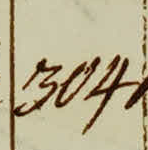304
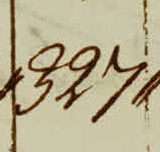327
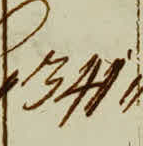341
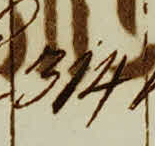314
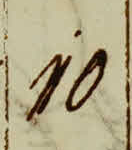10
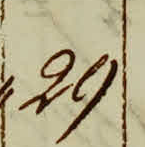29
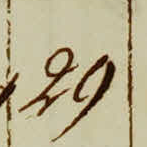29
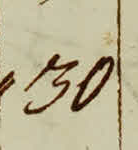30
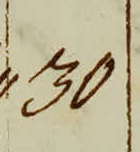30
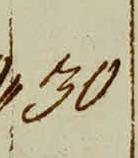30
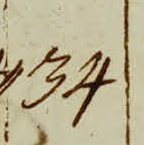34
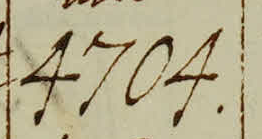4704.
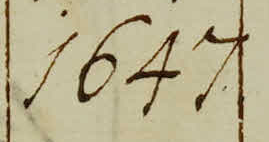1647
